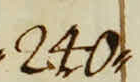240
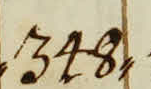348
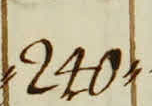240
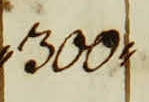300
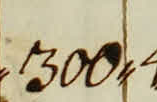300
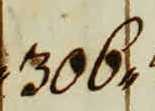306
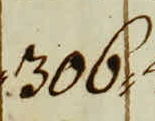306
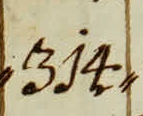314
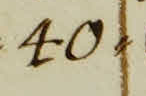40
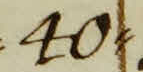40
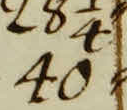40
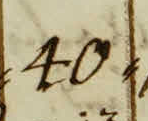40
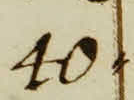40
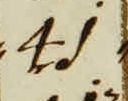41
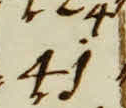41
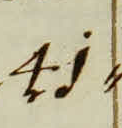41
